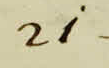21
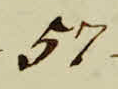57
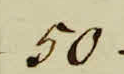50
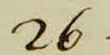26
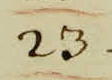23
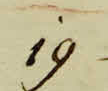19
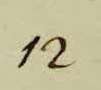12
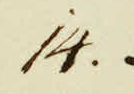14.
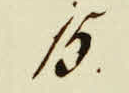15.
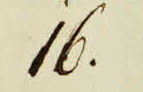16.
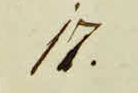17.
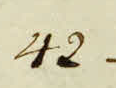42
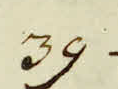39
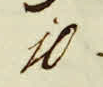10
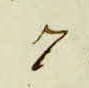7
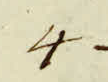4
